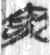寅
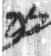卯
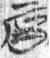晨
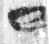巳
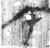午
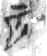戌
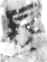是
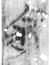胃（謂）
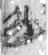○（絕）
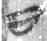日
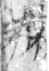無
